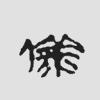備
